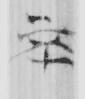不
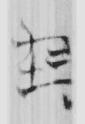均
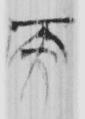侯
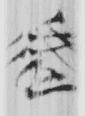𫊟
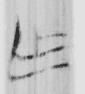乍
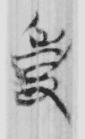事
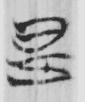是
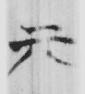亓
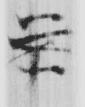不
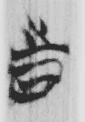{之日}
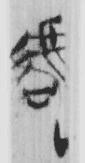唬
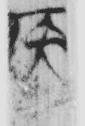侯
